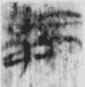馭（御）
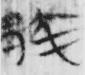○（蔡）
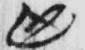臣
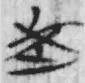武
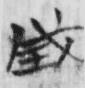城
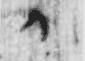人
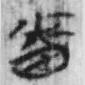番
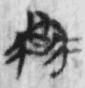嗌
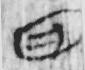耳
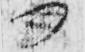月
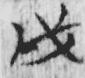戊
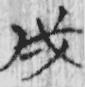戌
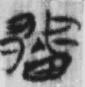鄱
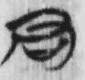君
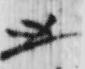之
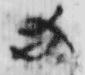右
